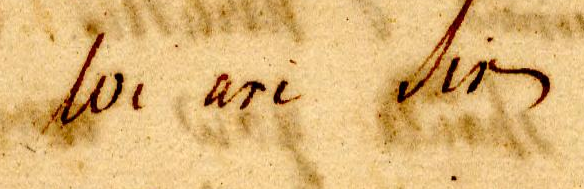We are Sir
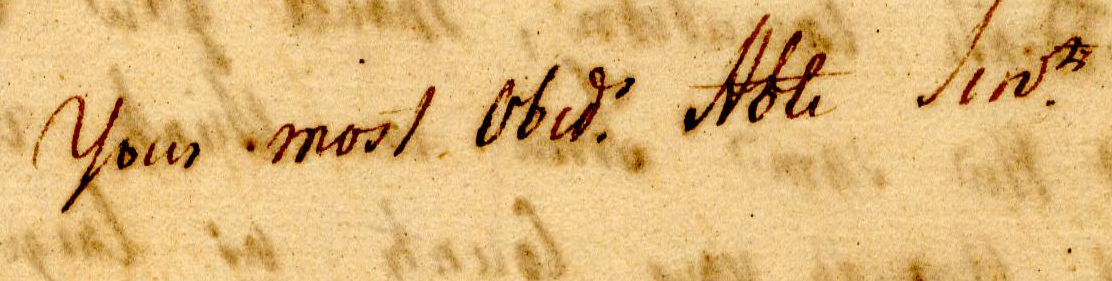Your most Obed^t. Hble Serv^t.
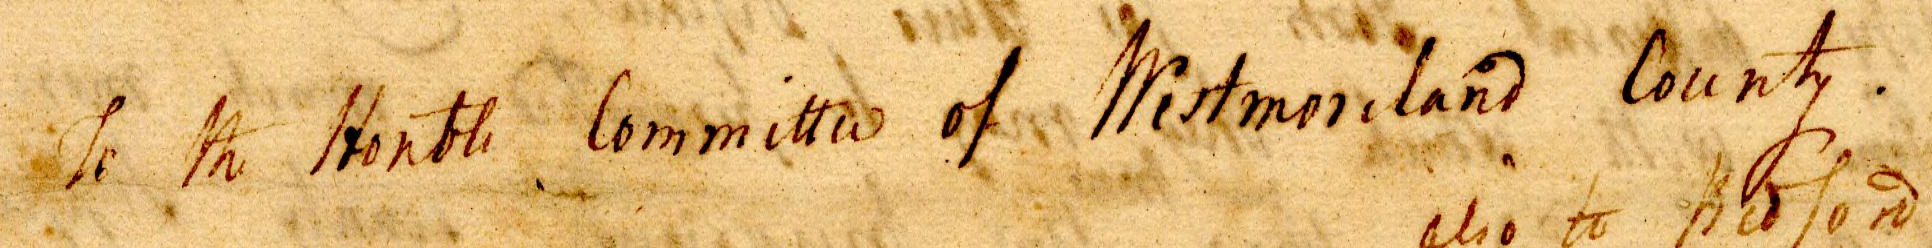To the Honble Committee of Westmoreland County.
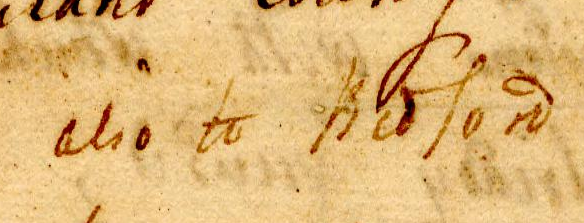also to Bedford
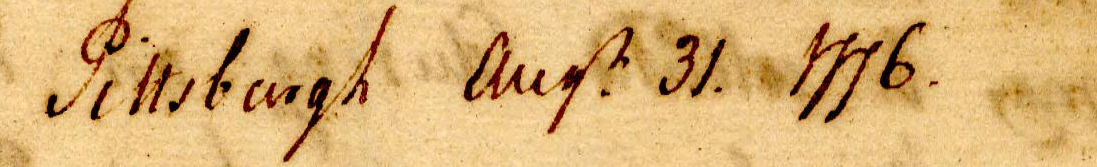Pittsburgh Aug^t. 31. 1776.
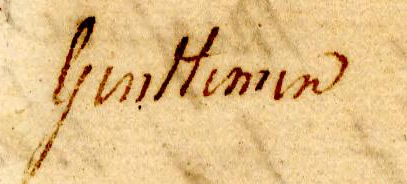Gentlemen
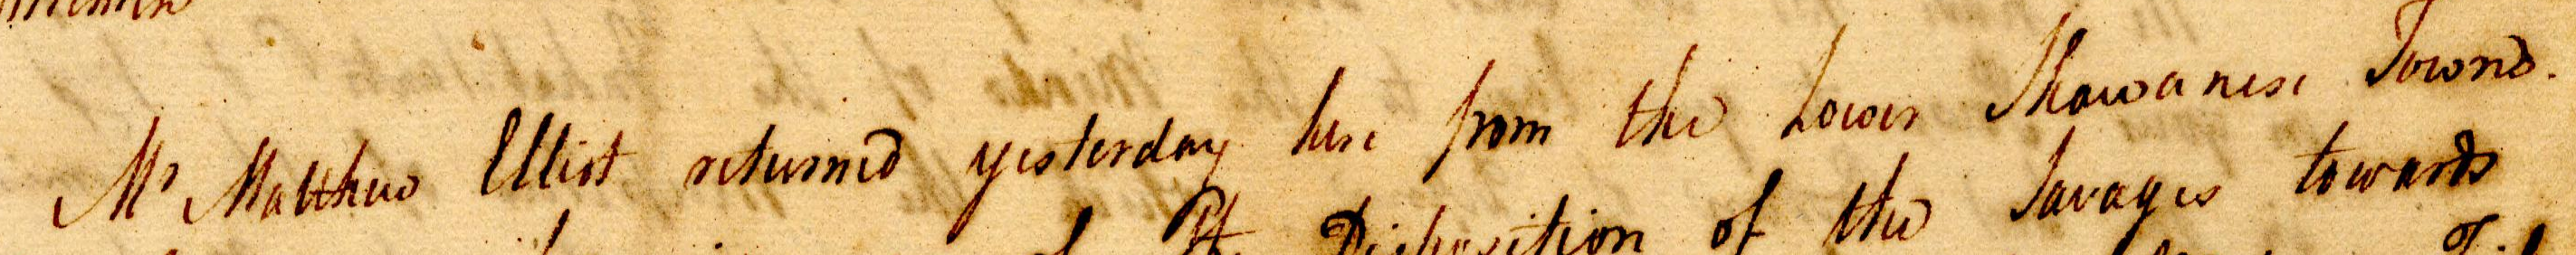M^r Matthew Elliot returned yesterday here from the Lower Shawanese Towns.
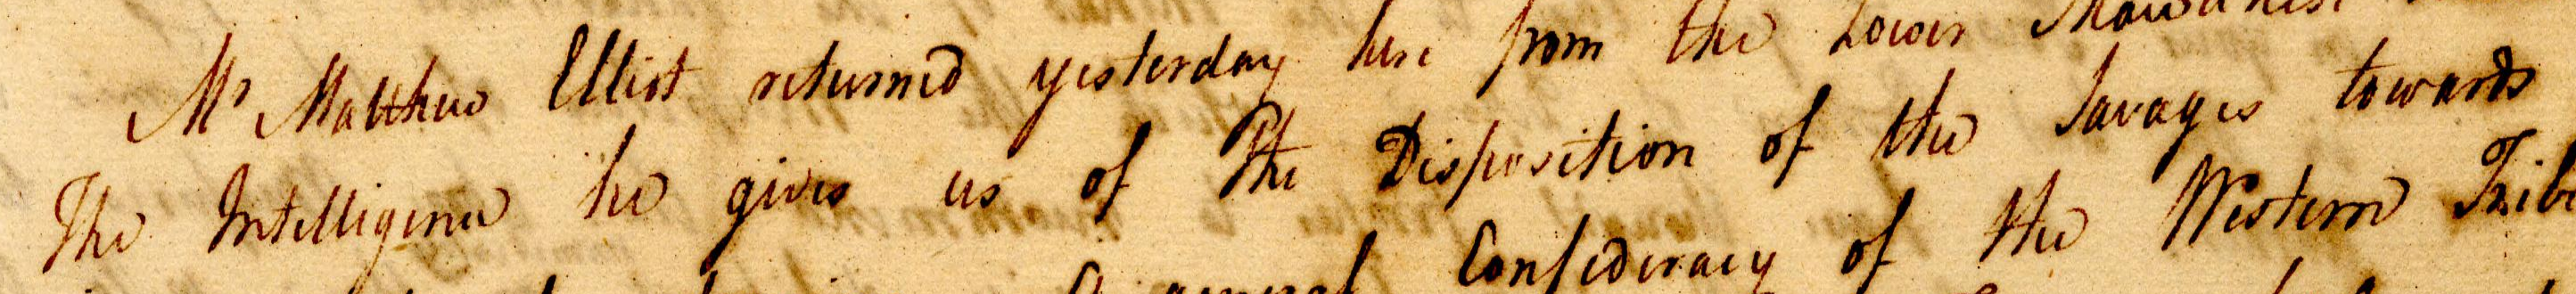The Intelligence he gives us of the Disposition of the Savages towards
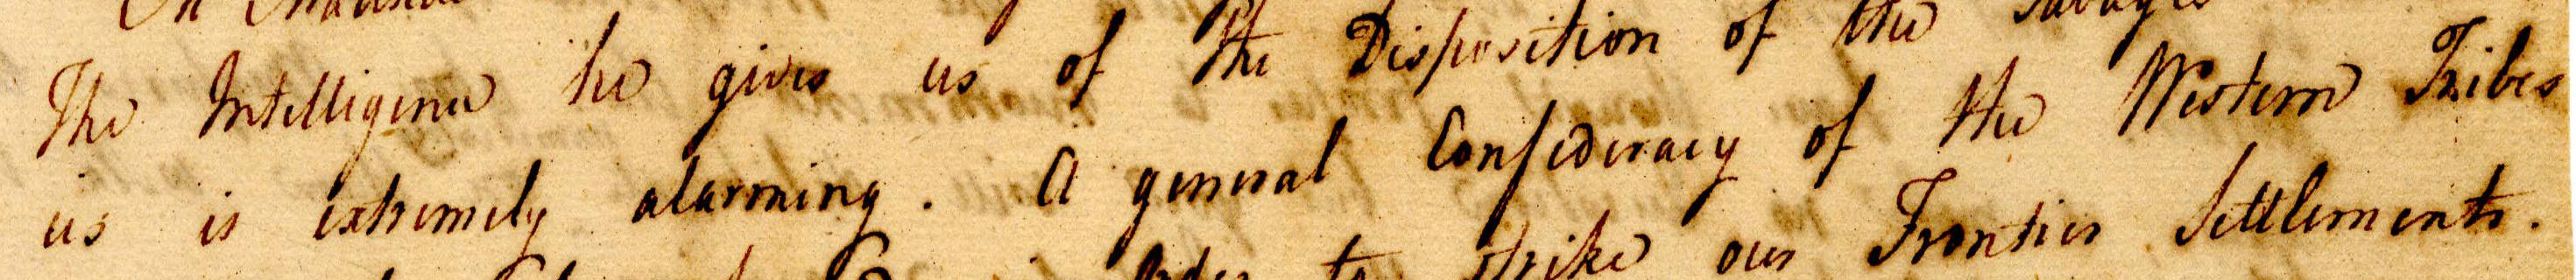us is Extremely alarming. A general Confederacy of the Western Tribes
